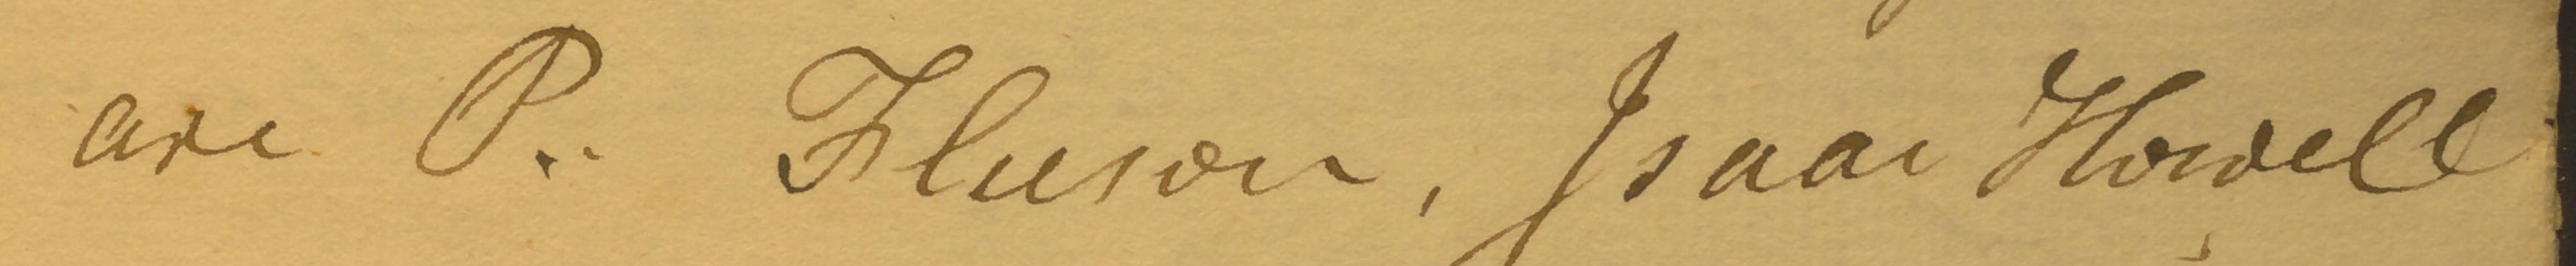are P. Fleeson Isaac Howell
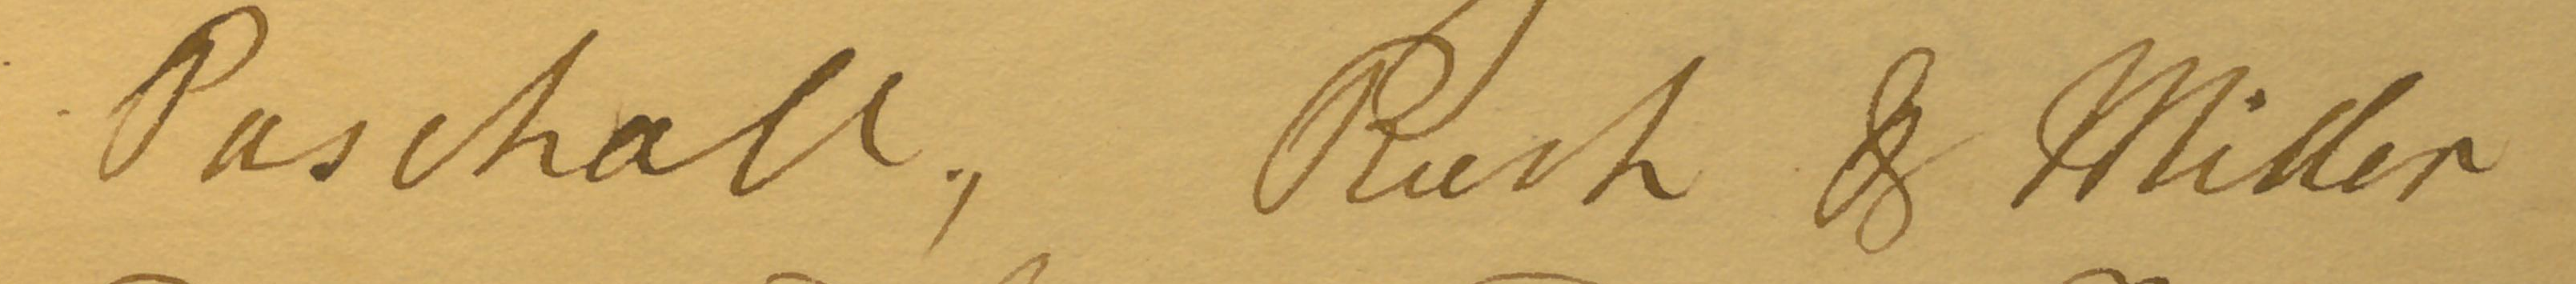Paschall, Rush & Miller
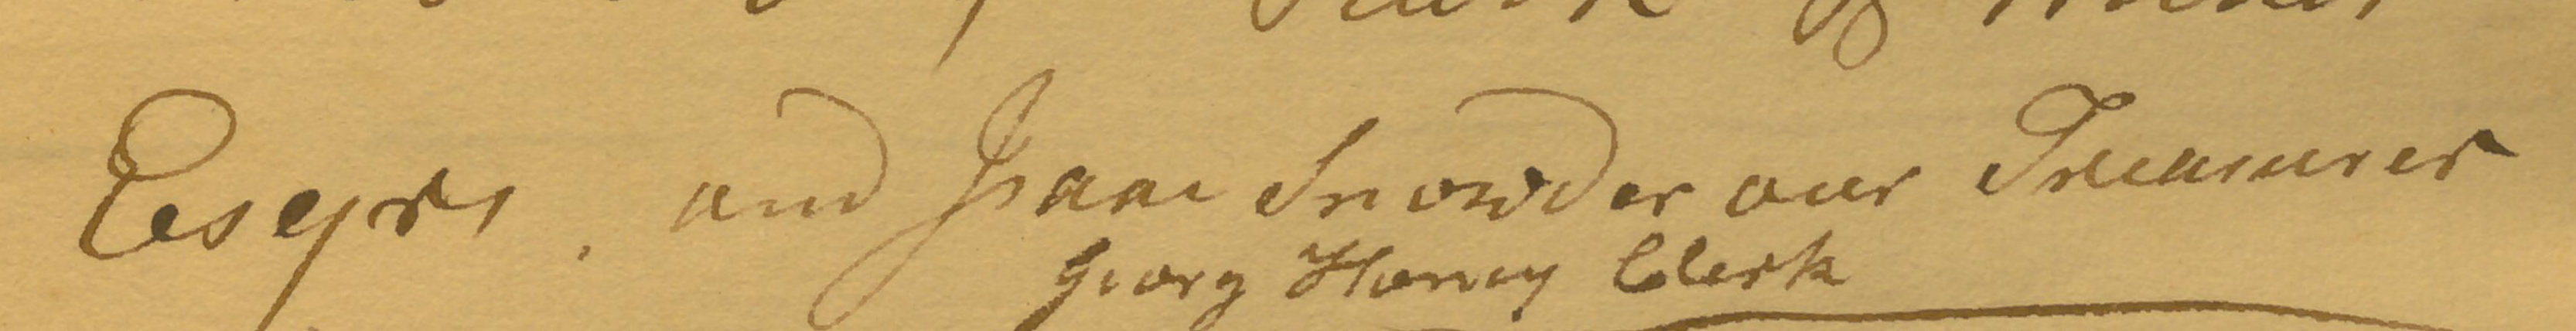Esqrs and Isaac Snowder our Treasurer
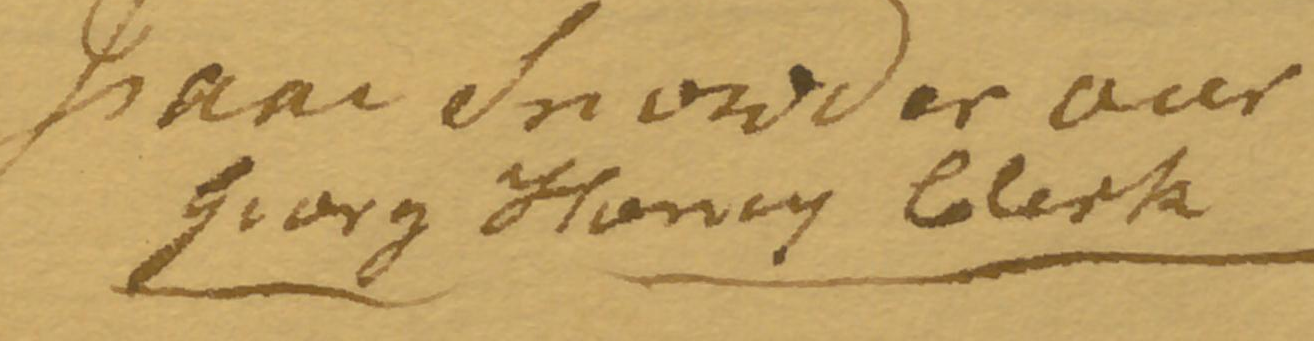Georg Henry Clerk
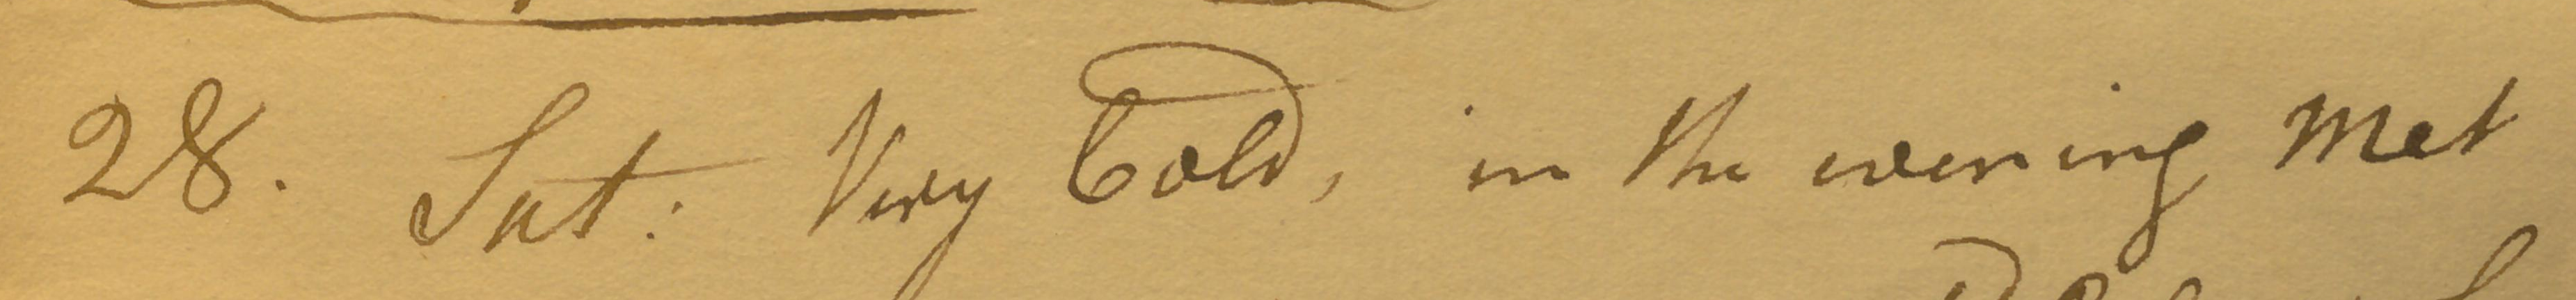28. Sat. Very Cold, in the evening met
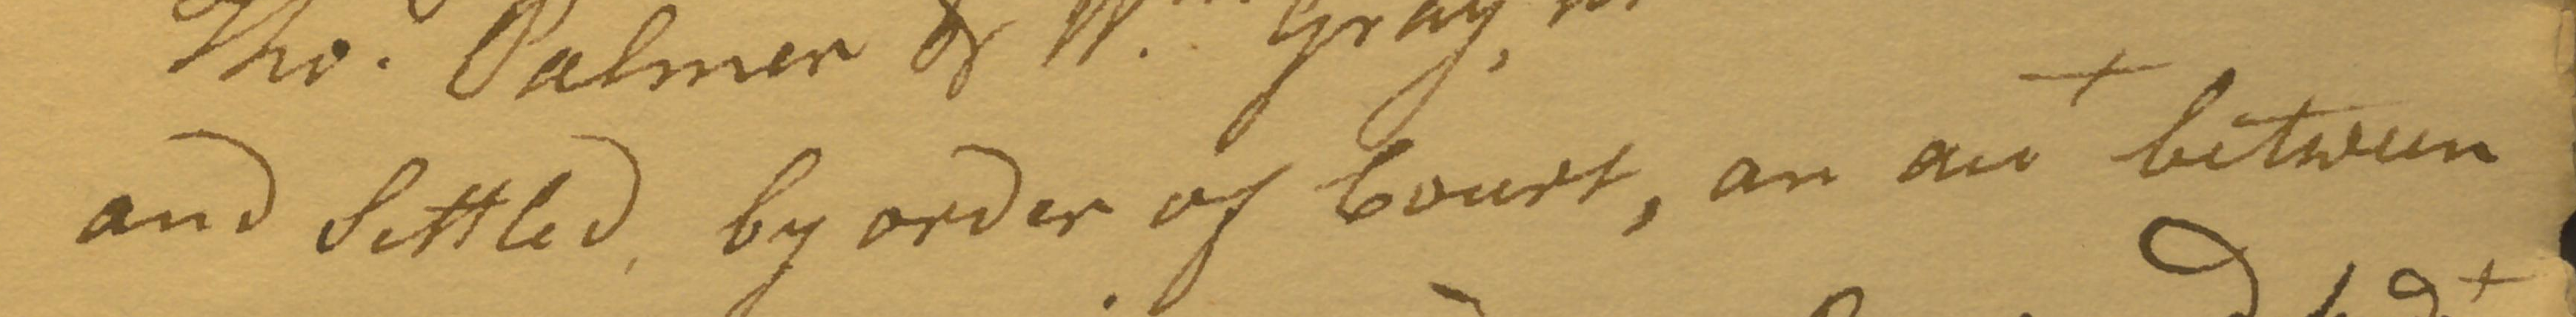and Settled, by order of Court, an acc^t between
